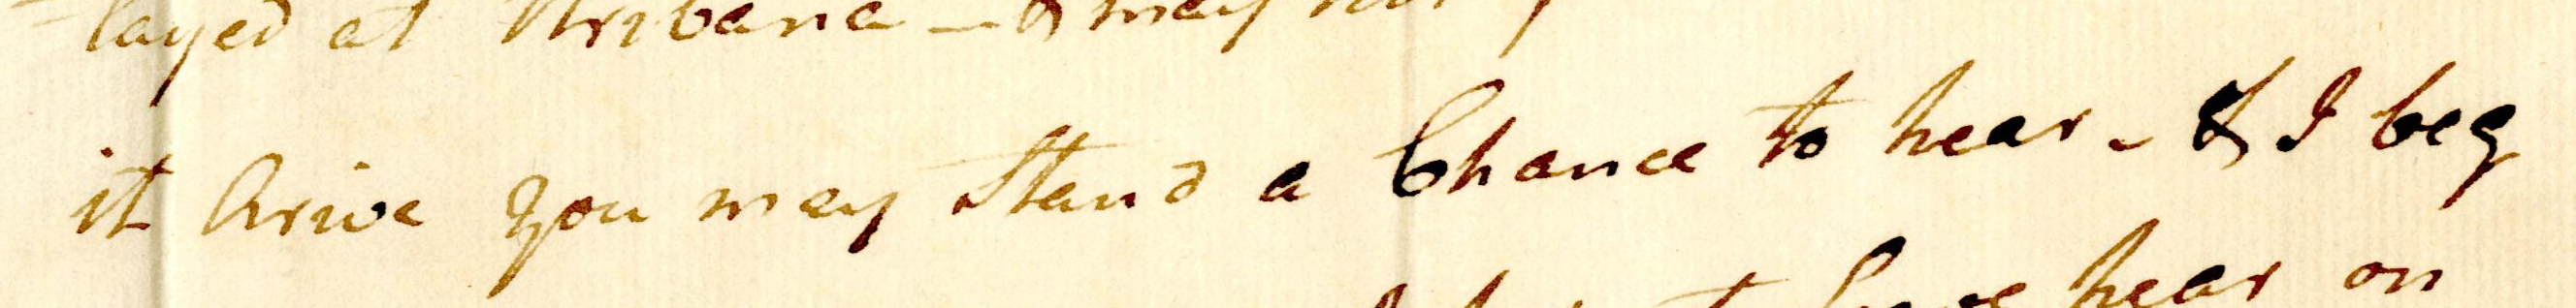it Arive you may Stand a Chance to hear. & I beg
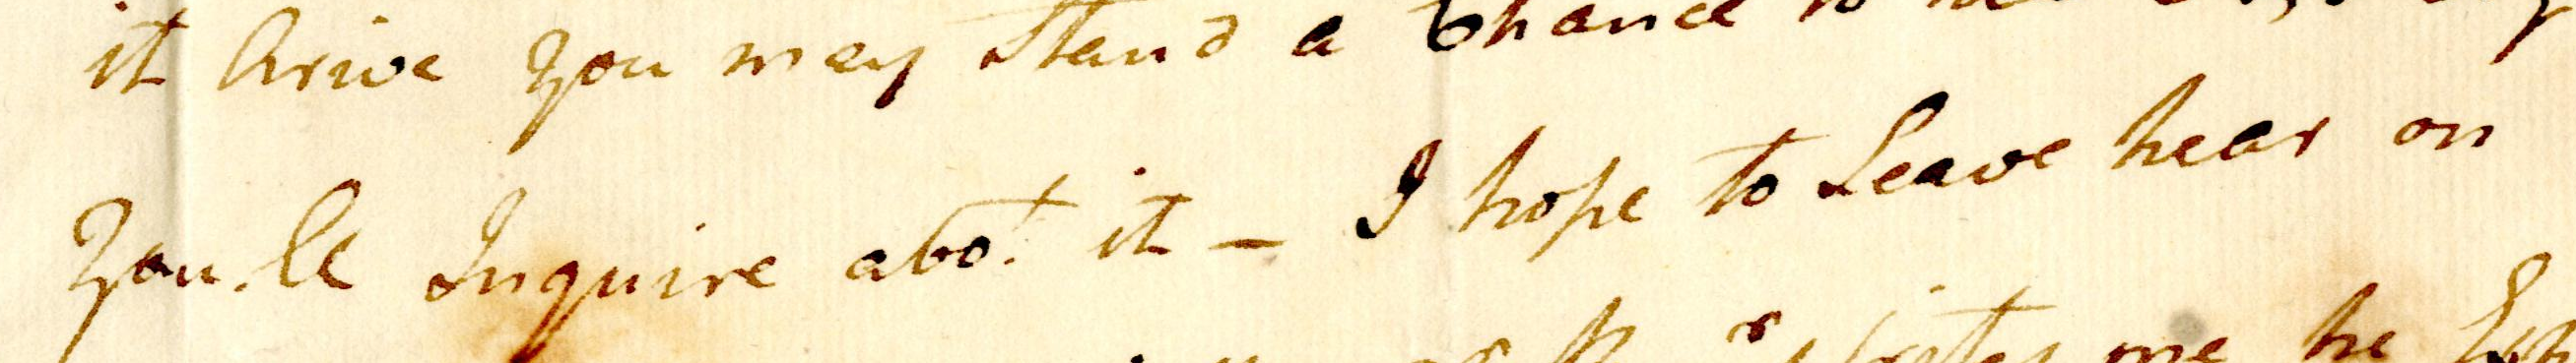You'll Inquire abo^t. it- I hope to Leave hear on
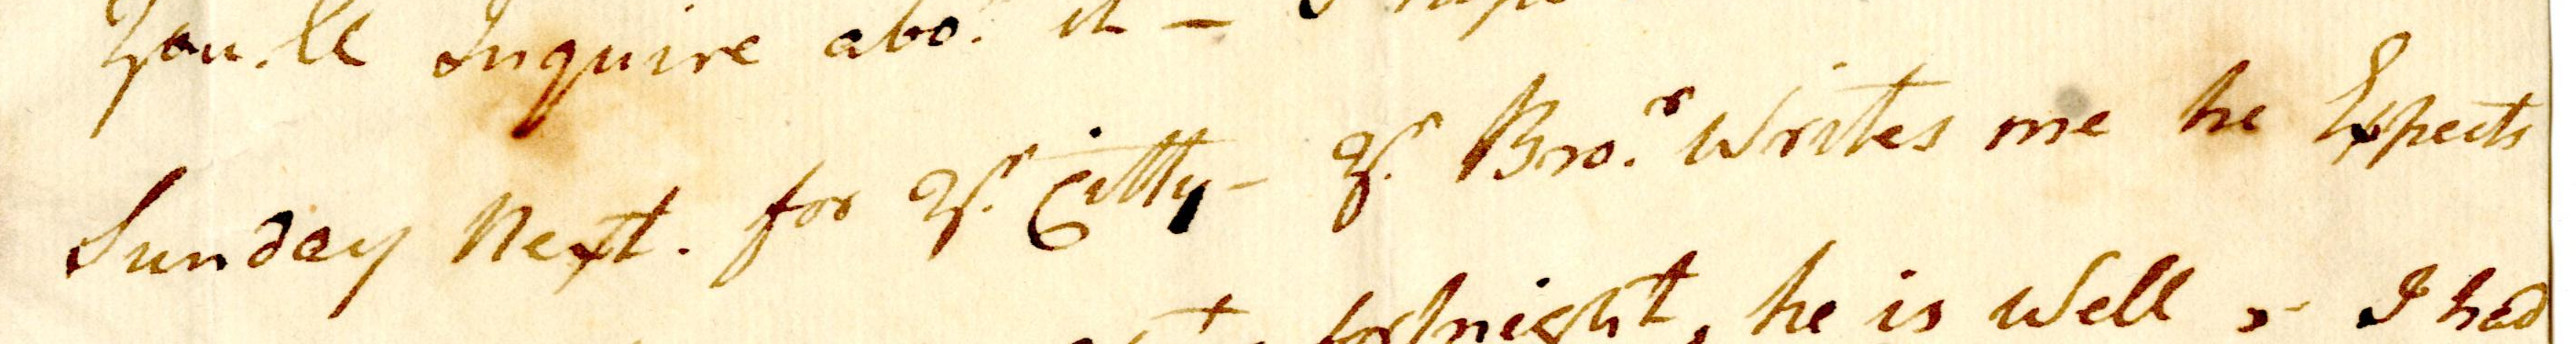Sunday Next. for y^r. citty- y^r. Bro^t. writes me he Expects
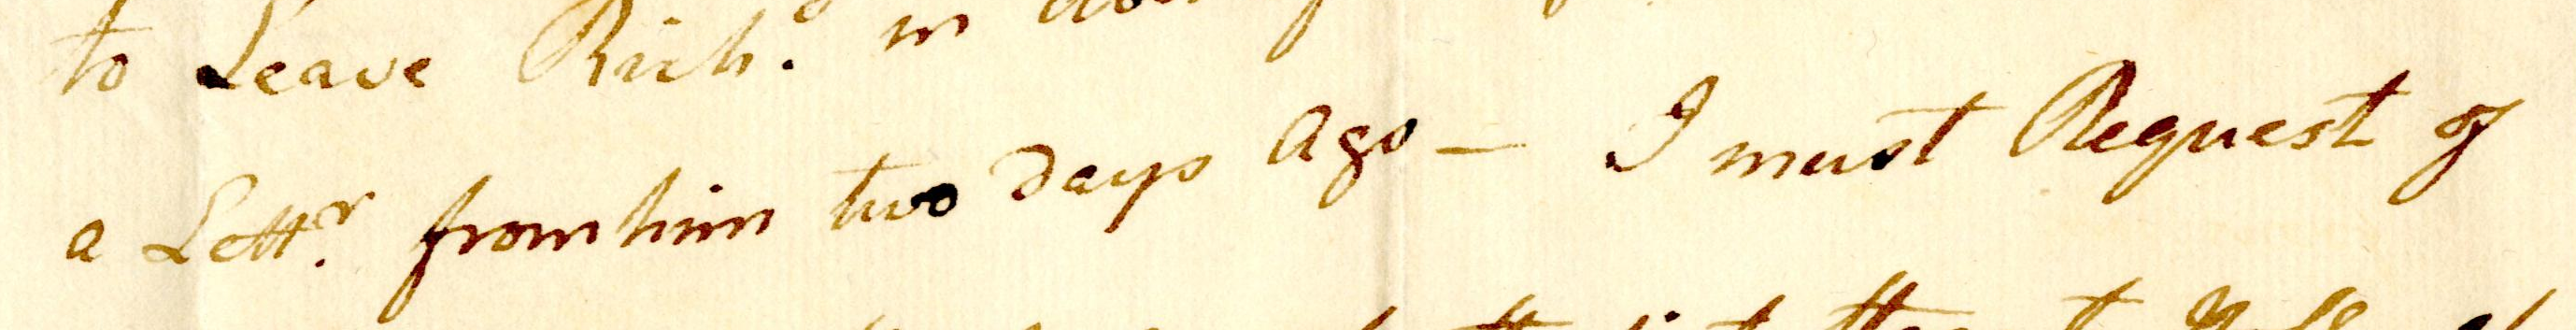a Lett^r. from him two days Ago- I must Request of
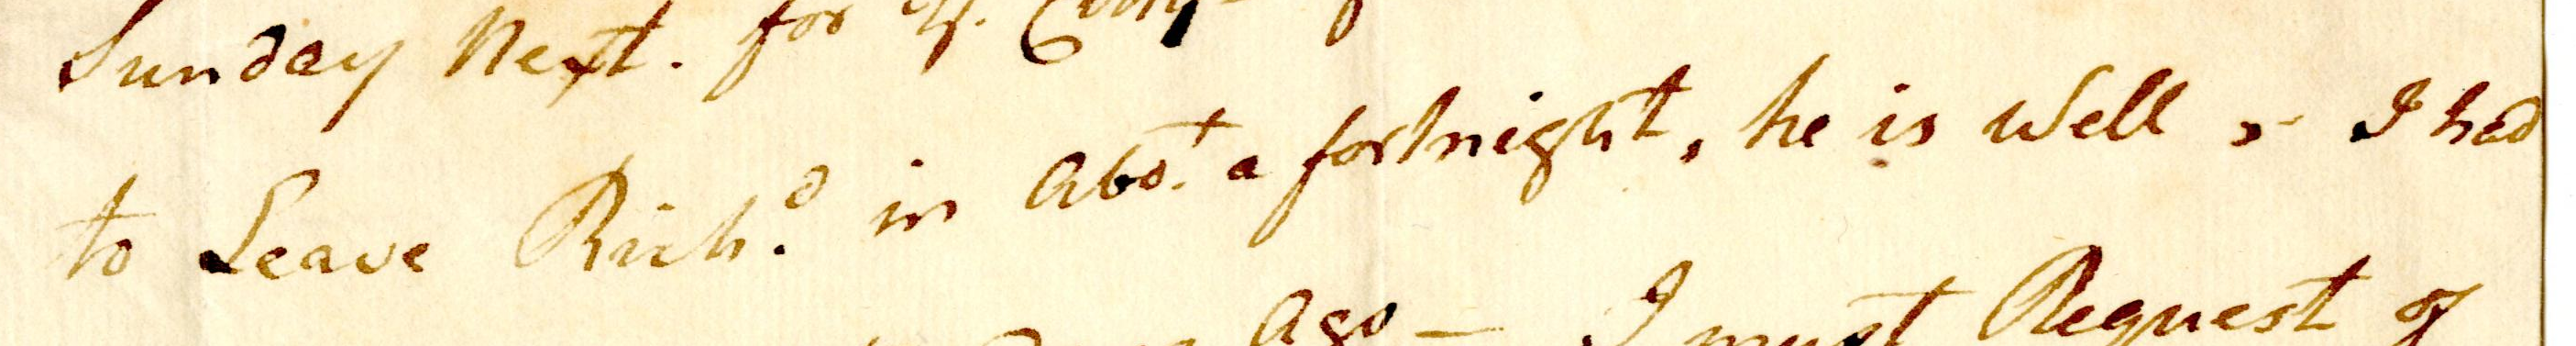to Leave Rich^d. in Abo^t. a fortnight, he is well. I had
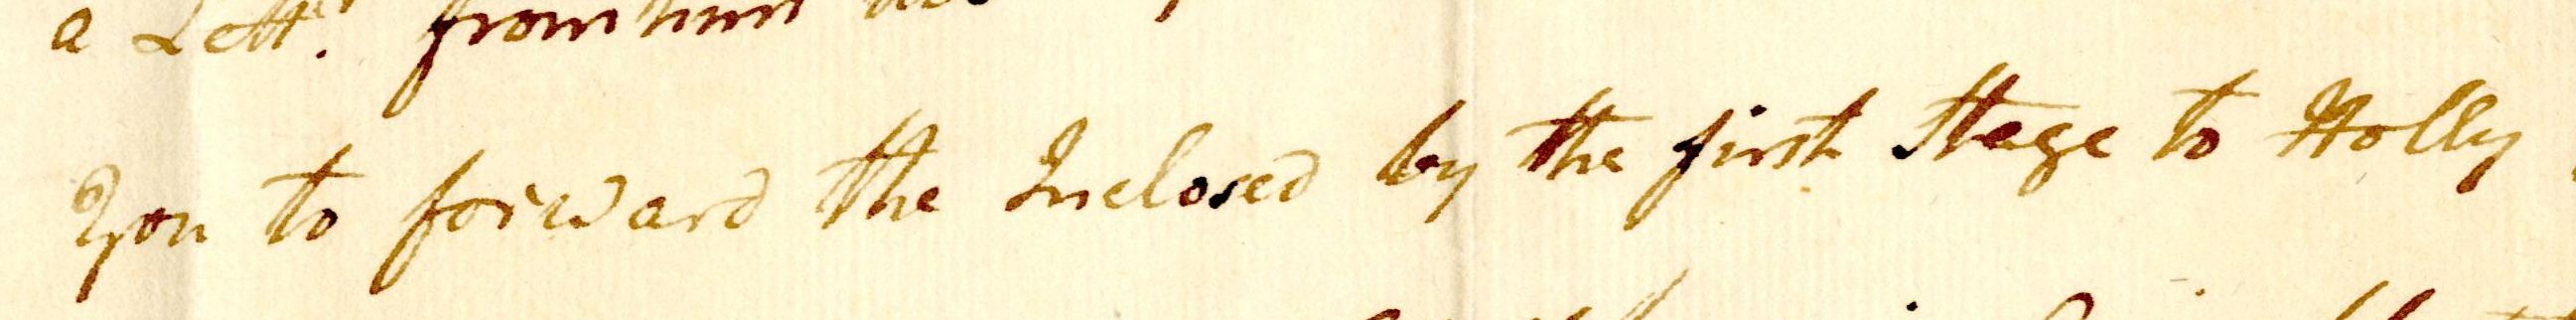you to forward the Inclosed by the first stage to Holly &
